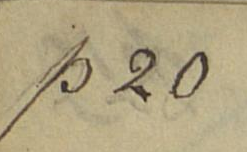p 20
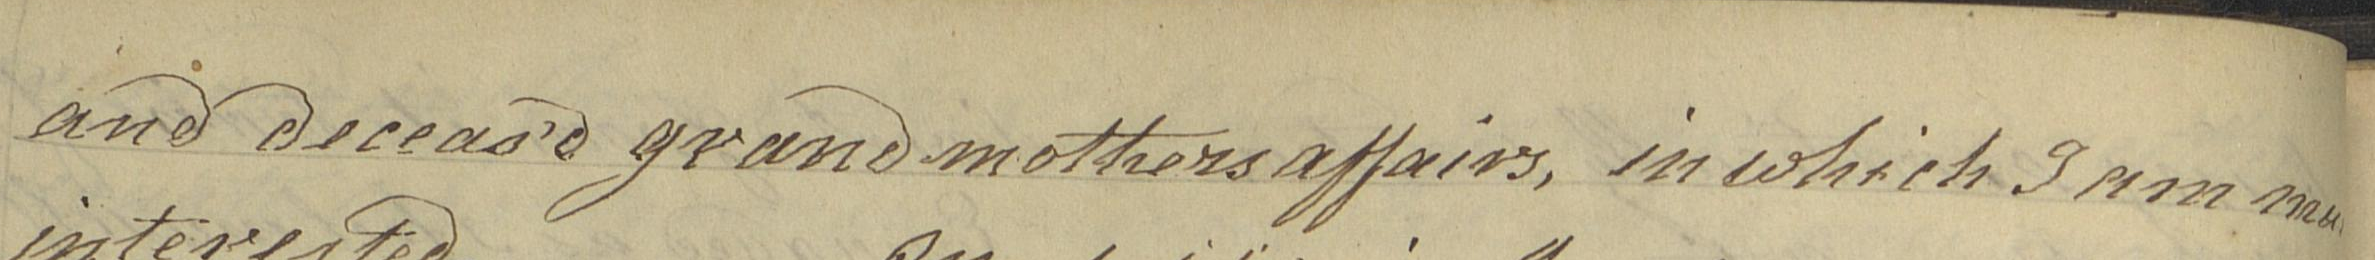and deceas'd grand mothers affair, in which I am now
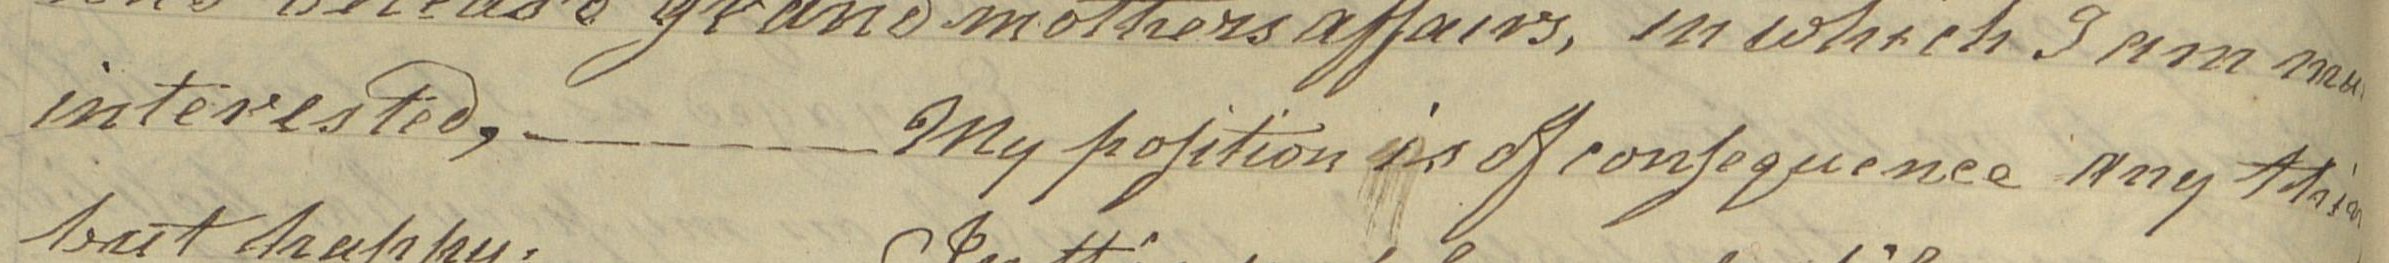interested,- My position is of consequence any thing
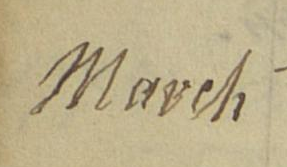March
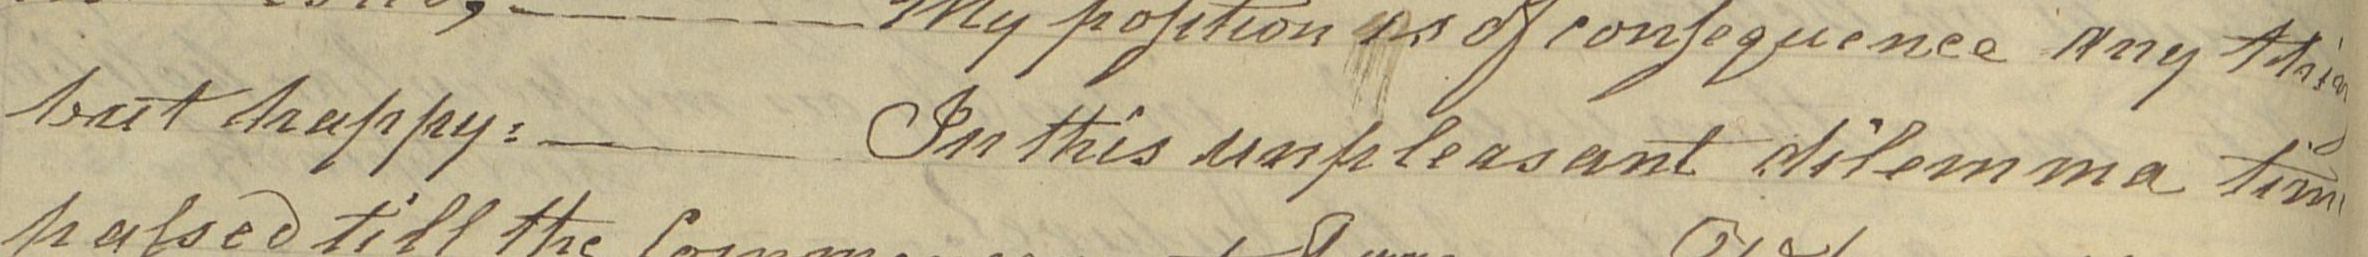but happy. In this unpleasant dilemma time
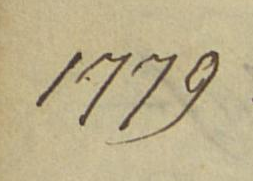1779
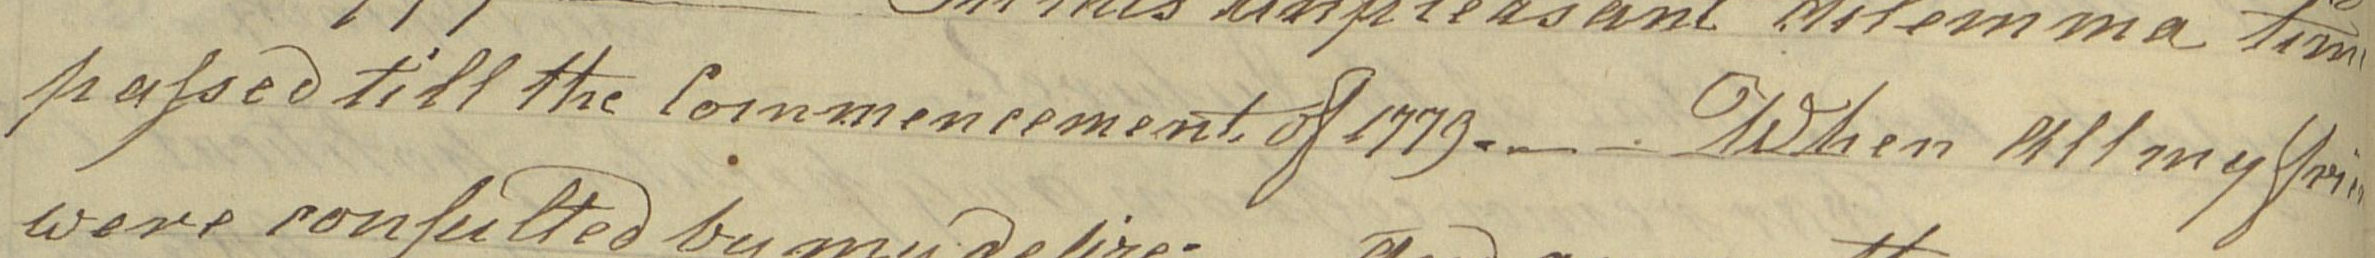passed till the Commencement of 1779. When all my fr-
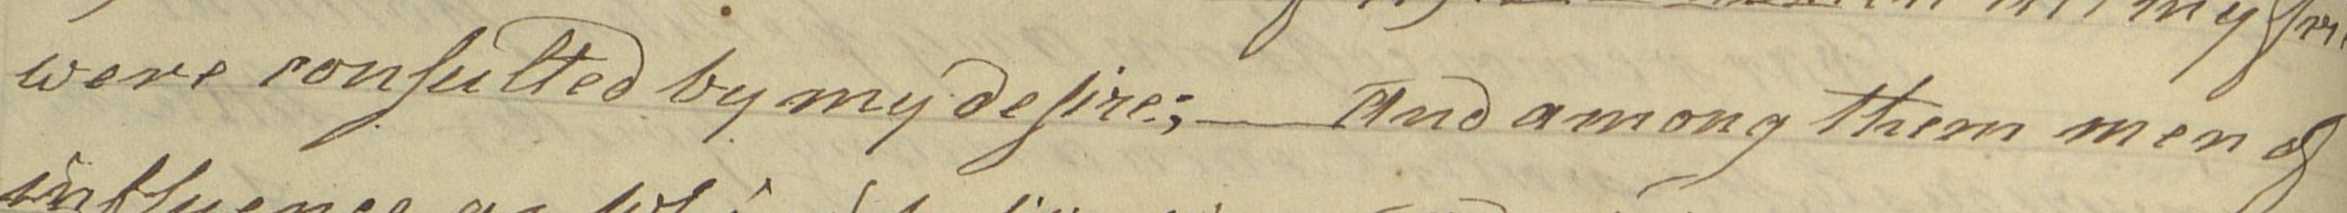were consulted by my desire; and among them men of
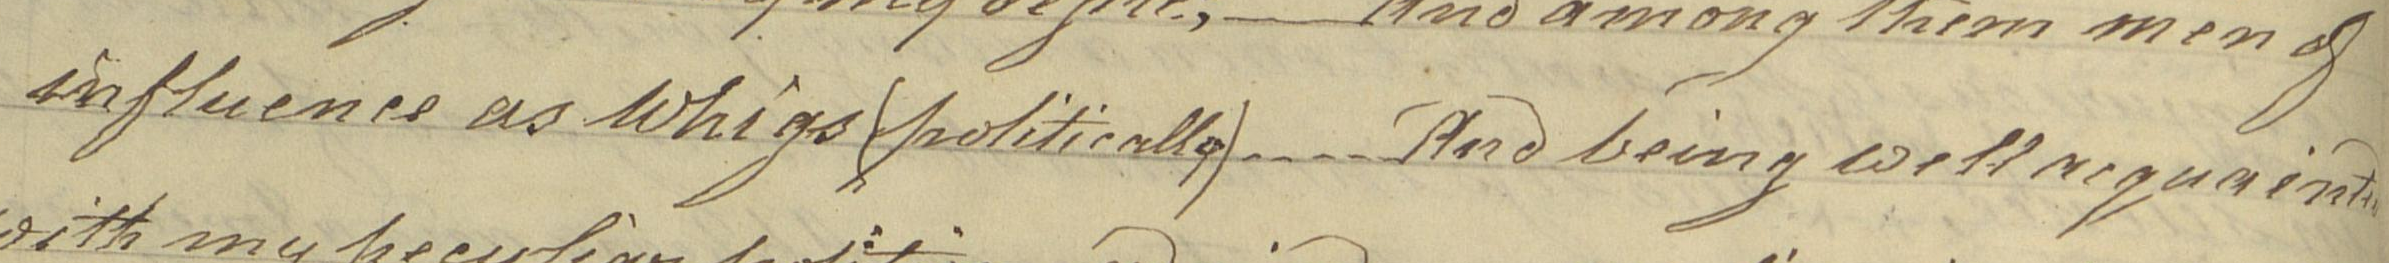influence as whigs (politically) And being well acquaint-
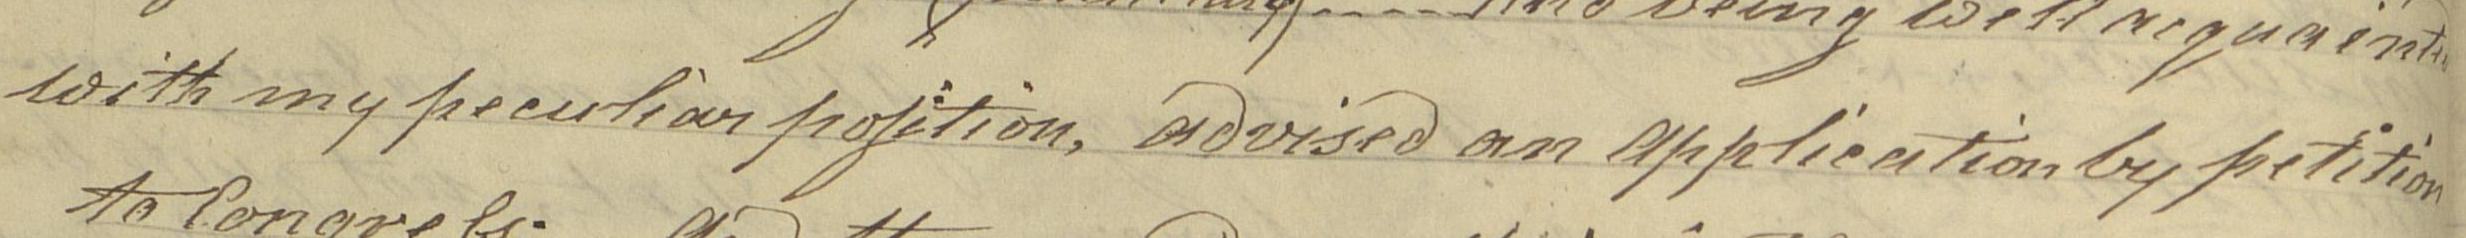with my peculiar position, advised an application by petition
